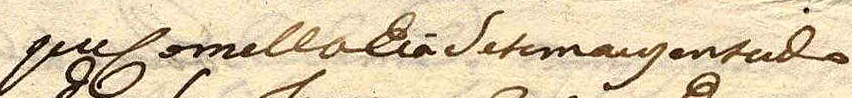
que Com ella hia Se tem auzentado
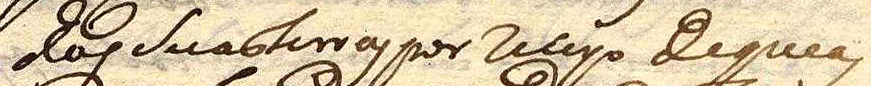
das Suas terras por Receyo de que as
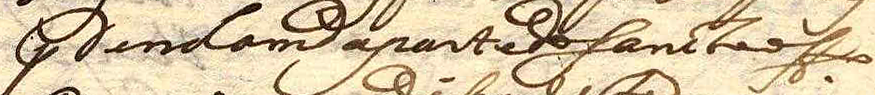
prendam da parte do sancto off.o
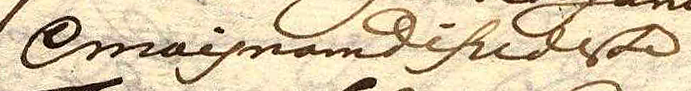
e mais nam disse deste
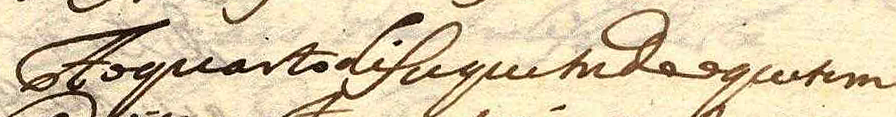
Ao quarto disse que tudo o que tem
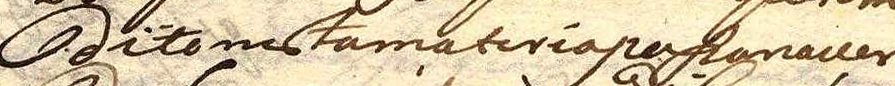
dito nesta materia passa na uer
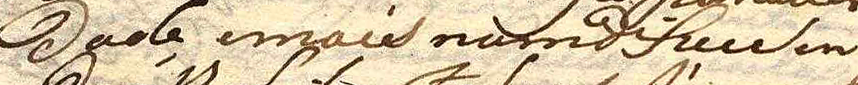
dade, e mais nam disse, e Sen
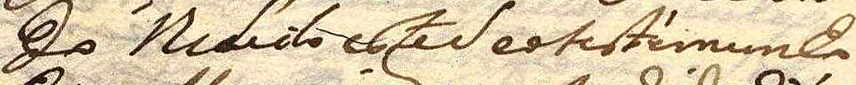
do lhe Lido este Seo testemunho
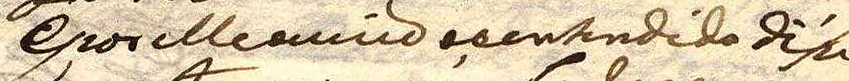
e por elle ouuido, e entendido disse
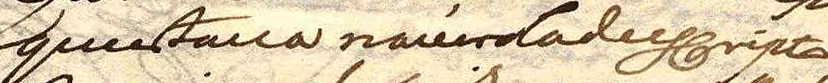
que estaua na uerdade esCripto
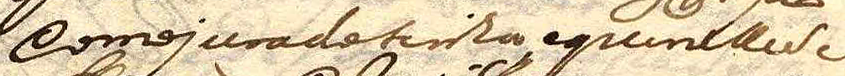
Como jurado tinha e que nelle se
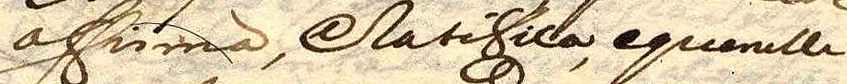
affirma, e Ratificia, e que nelle
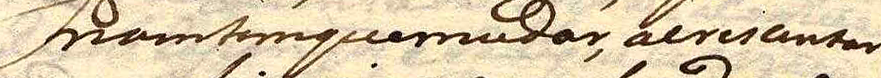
nam tem que mudar, acrescentar
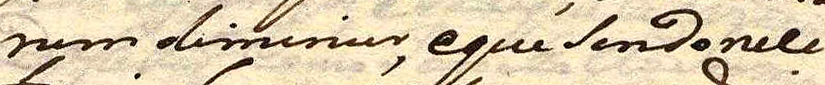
nem diminuir, e que sendo nece
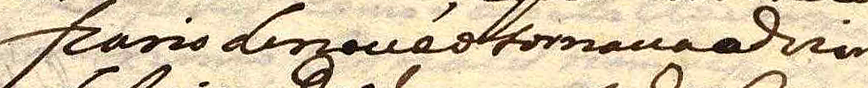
ssario de nouo o tornaua a dizer
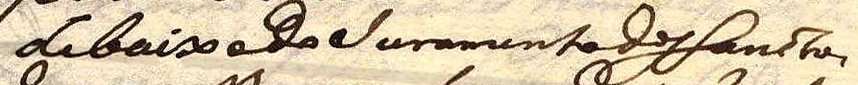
debaixo do Iuramento dos sanctos
